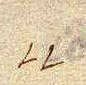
11
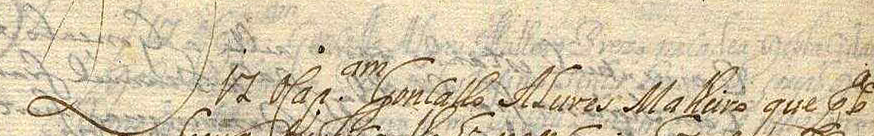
Diz o Cap.am Gonçallo Alures Malheiro que pa b
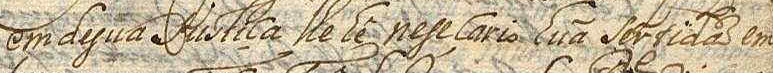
em de sua Iustiça lhe hê neseÇario huā sertidaõ em
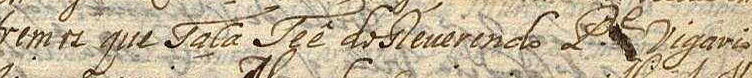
tremos que Faça Feê do Reuerendo P.e Vigario
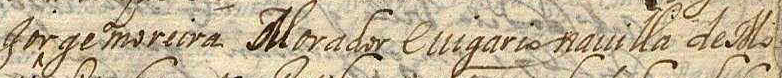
Jorge moreira Morador E uigario na uilla de Mo
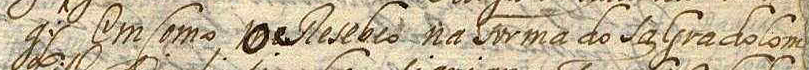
gy em Como o Resebeo na Forma do salgrado Com
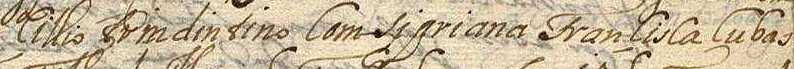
Cillio trimdintino Com sjpriana FranCisCa Cubas
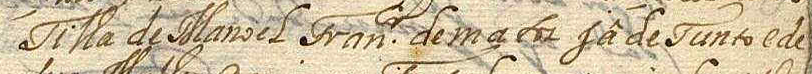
Filha de Manoel Fran.co de matoz jâ deFunto e de
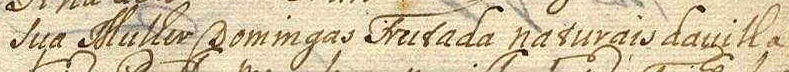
Sua Mulher Domingas Frutada naturais da uilla
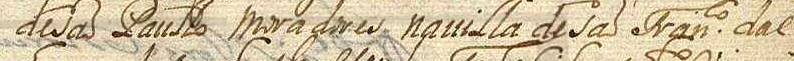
de saõ Paullo moradores na uilla de saõ Fran.co da c
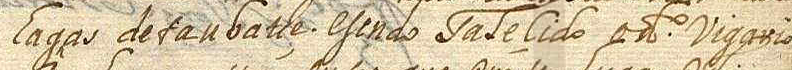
hagas de taubathe; e sendo FaleCido o d̄.o Vigario
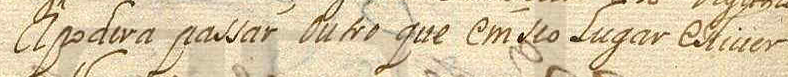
A podera passar outro que em seo Lugar estiuer
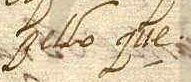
pello que.
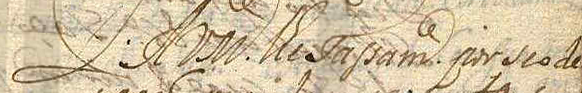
P. A V M.ce lhe Fassa m.ce por seo de
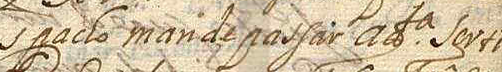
spacho mande passar a d̄.a serti
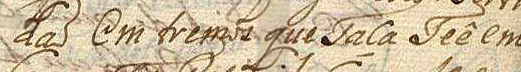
daõ em tremos que Faça Feê em
